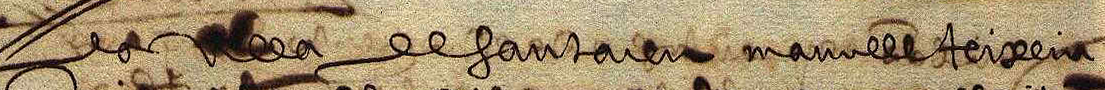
da villa de santarem manoell teixeir
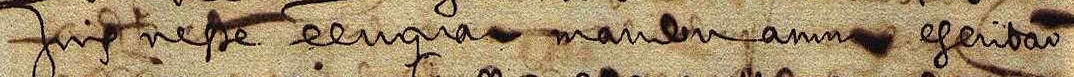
Juis neste lluguar mandou a mim escrivaõ
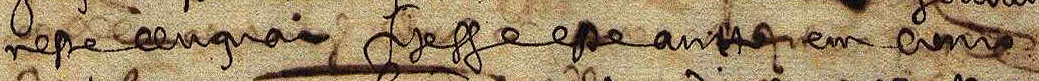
neste lluguar fisesse este autterem como
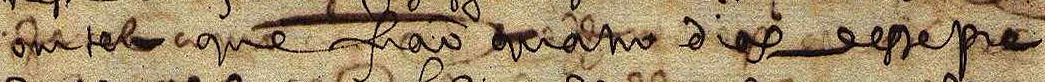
omtem que foraõ quatro dias deste pre
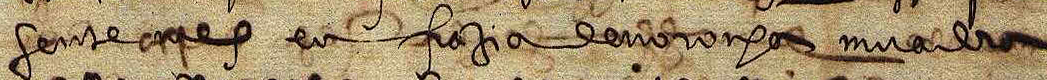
sente mes eufrazia de noronha moradora
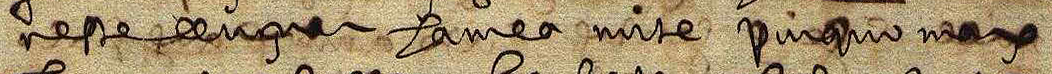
neste lluguar ha mea noite pouquo mais
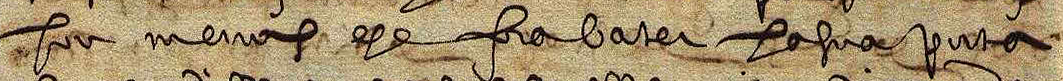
hou menos lhe fora bater ha sua porta
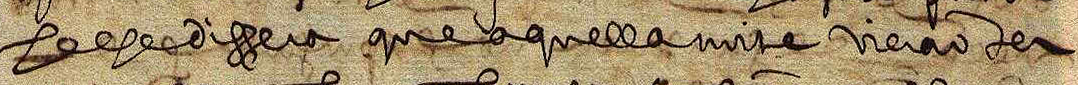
he lhe dissera que aquella noite vieraõ ter
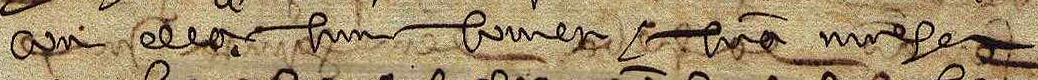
con ella hum homem e huā molher
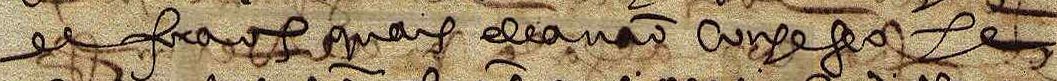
de fora os quais ella naõ conheseo he
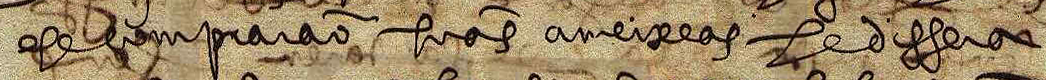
lhe compraraõ huās ameixeas he dissera
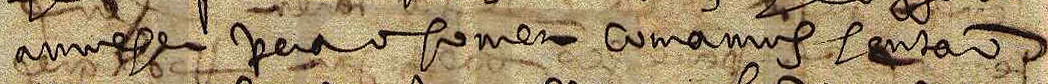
a molher pera o homem comamos e entaõ
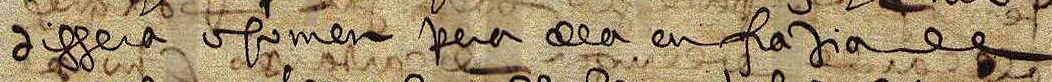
dissera o homem pera ella eufrasia de
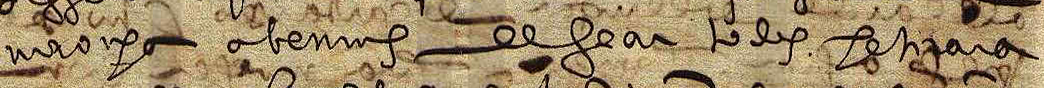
noronha abemos de sear todos he tirara
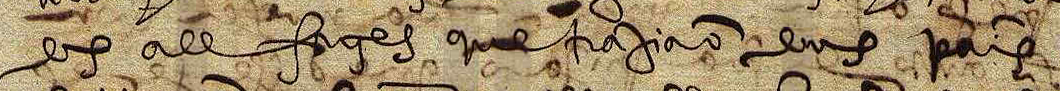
dos allforges que traziaõ dous paĩs
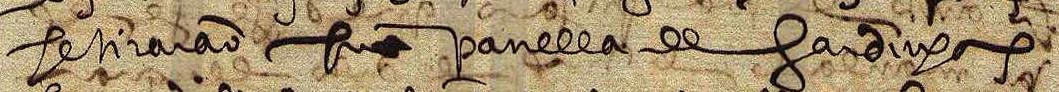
he tiraraõ huā panella de sardinhas
